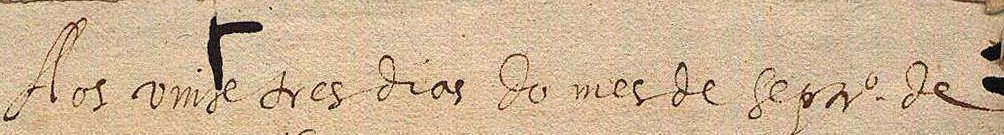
Aos vinte tres dias do mes de Septro. de
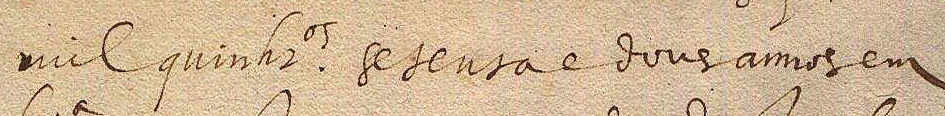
mil quinhtos. setenta e dous annos em
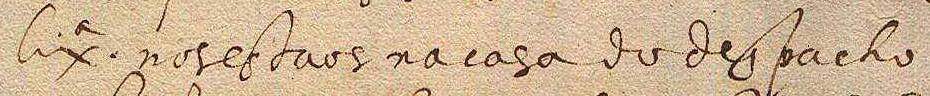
lixa. nos estaos na casa do despacho
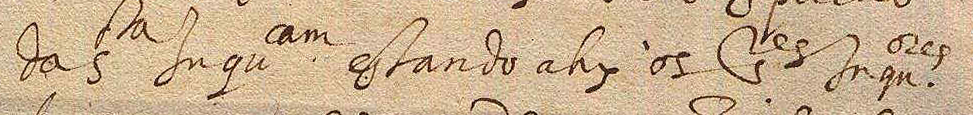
da scta Inqucam. estando ahy os sres Jnqu.ores
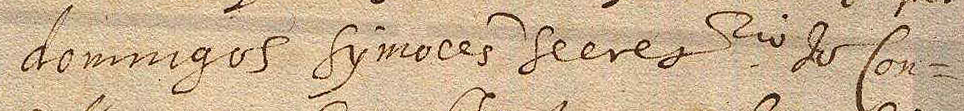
domingos symoeẽs secretrio do Con
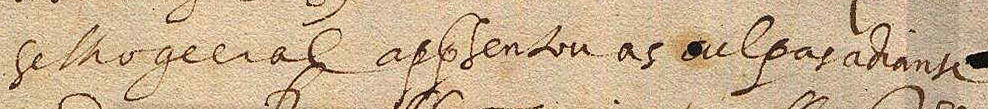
selho geeral app̄sentou as culpas adiante
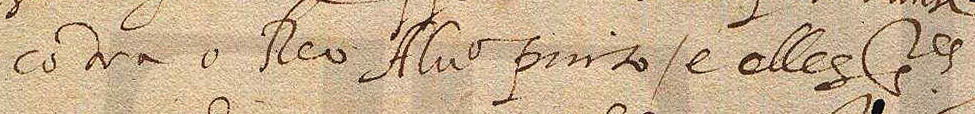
cōtra o Reo Aluo pinto / e elles sres.
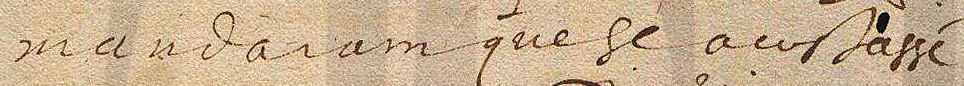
mandaram que se acostassē
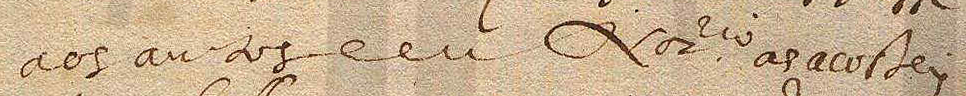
aos autos e eu Not.rio as acostey
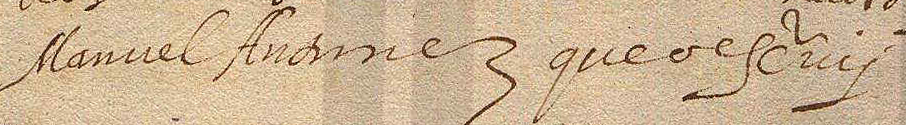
Manuel Antunez que o escriuj
